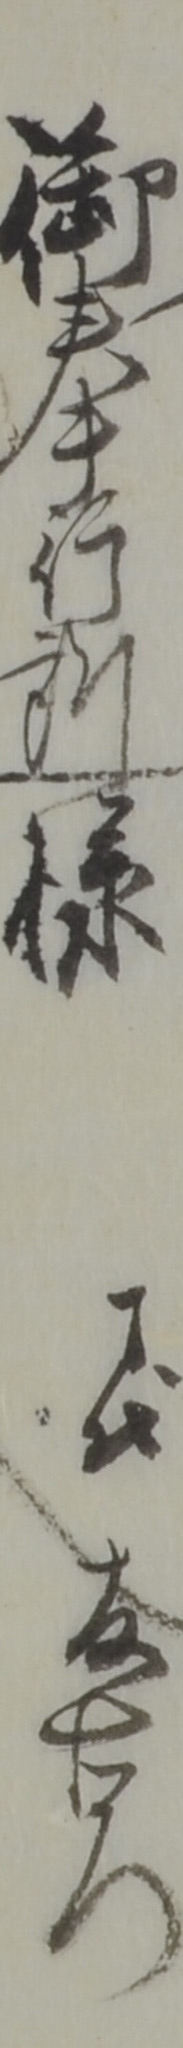御奉行所様丁代友右衛門
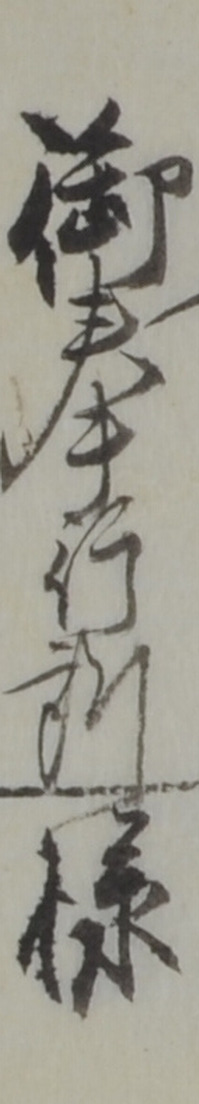御奉行所様
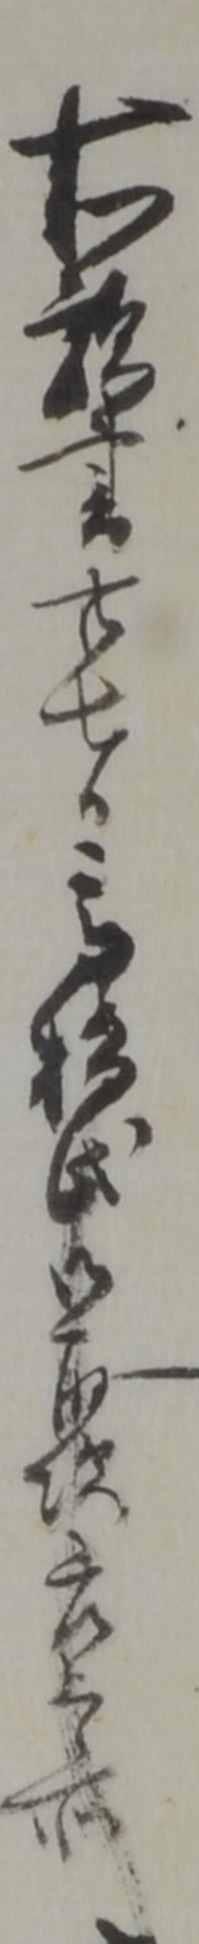右願書廿七日高橋氏御取次差上候所
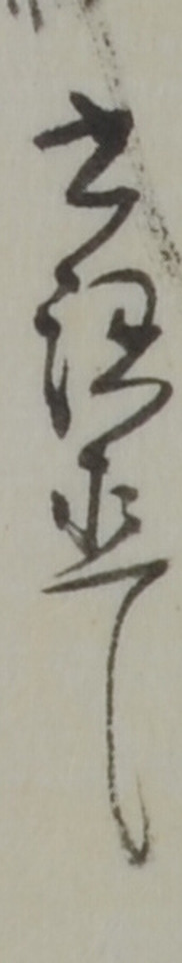書認直候
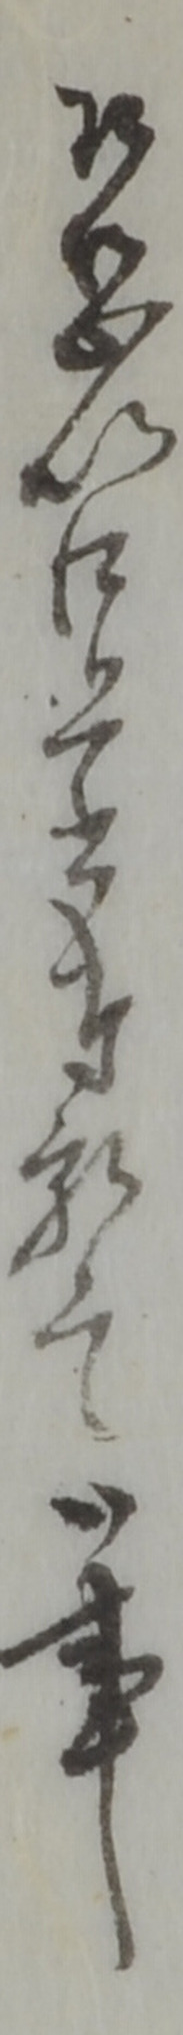乍恐以口上書奉願上候御事
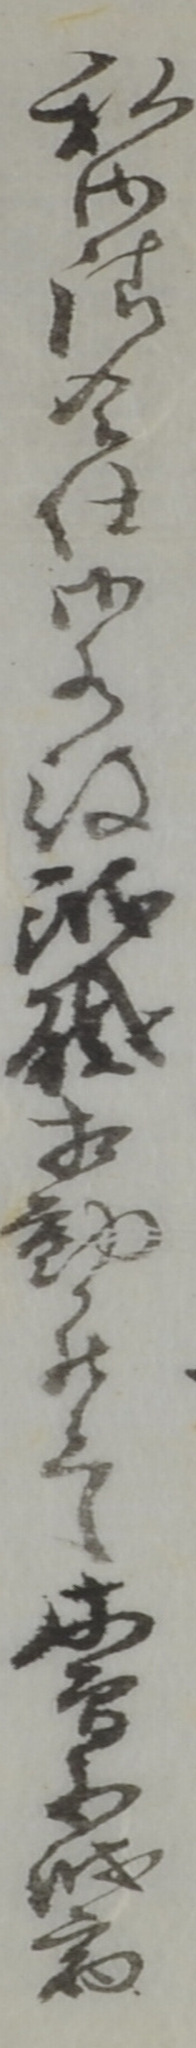私御請合仕御水役鍛冶職相勤罷上候木曽宮越宿
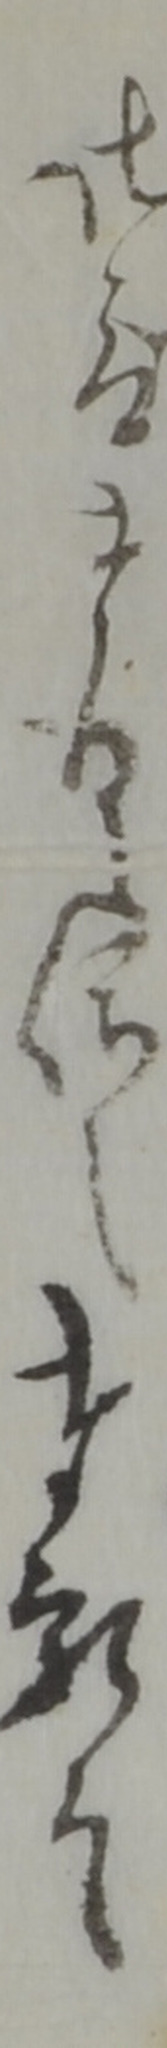仕分奉存候依之奉願上候
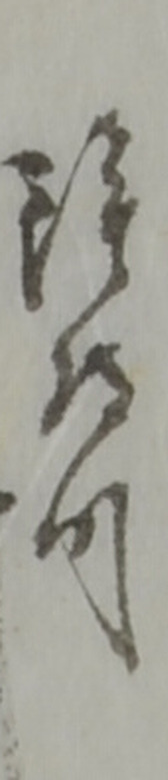鉾持町
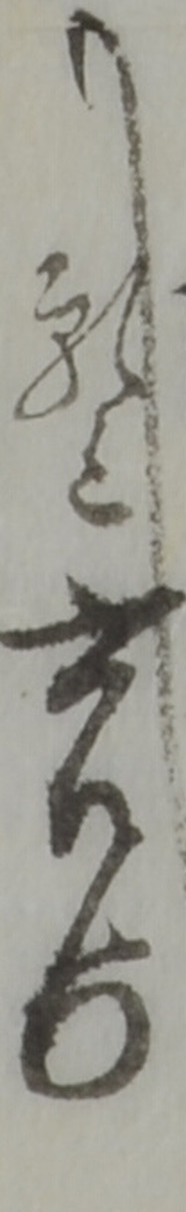願主六衛門
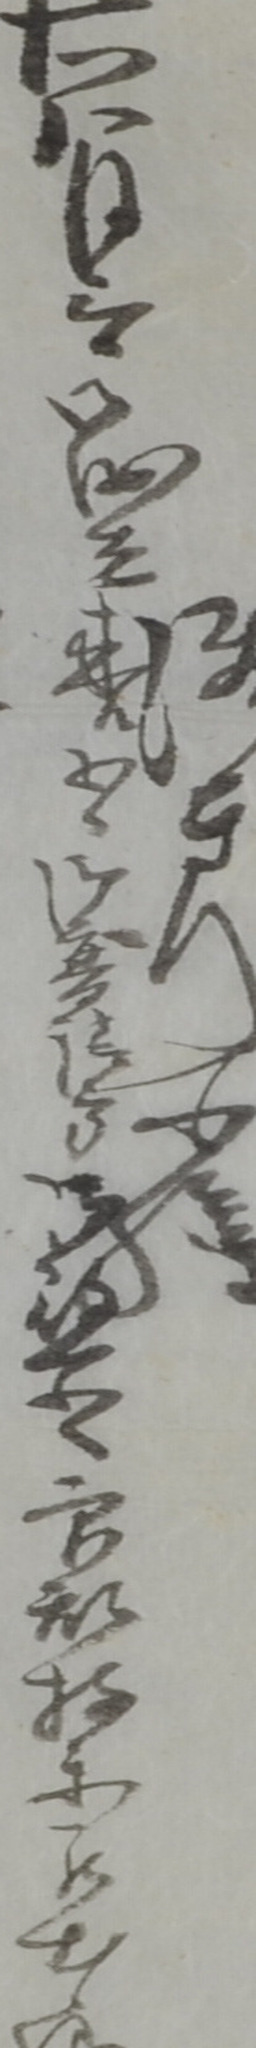右八月三日御沙汰来ル五日御普請方御役所へ印形持参罷出
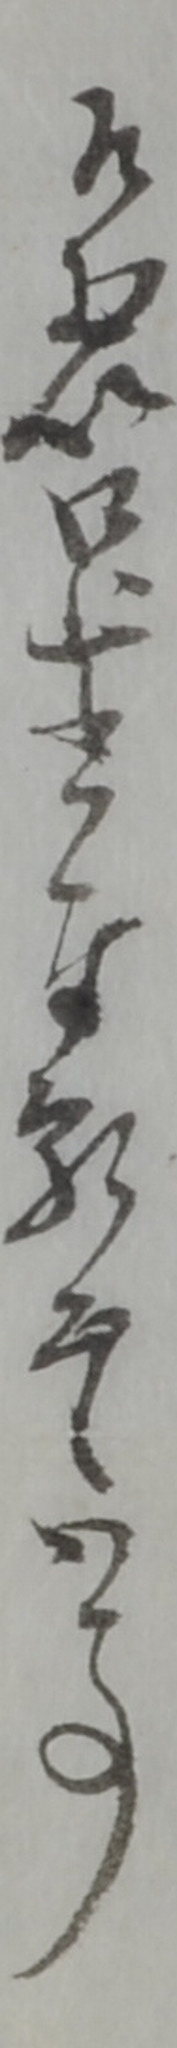乍恐以口上書奉願上候御事
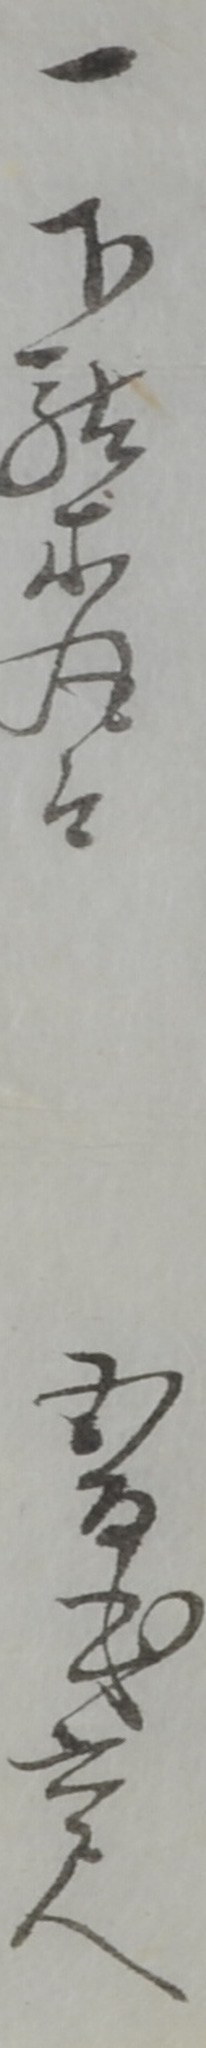一下駄木丸太五百本六尺
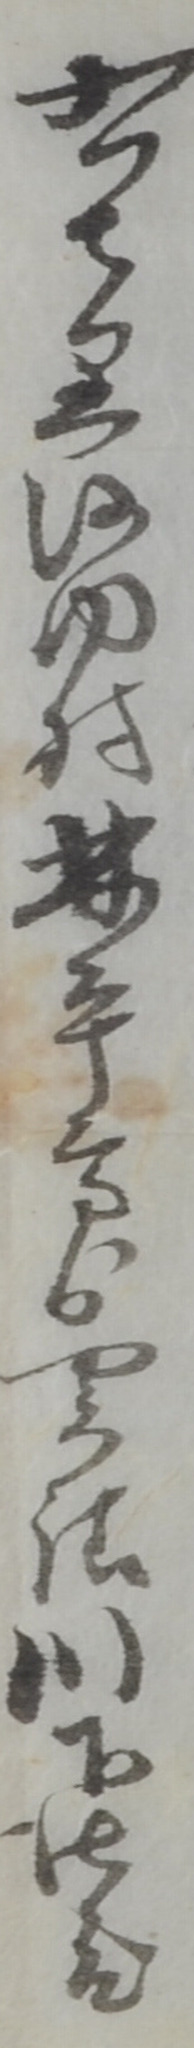右者黒河内村井平方ゟ買請川下仕度

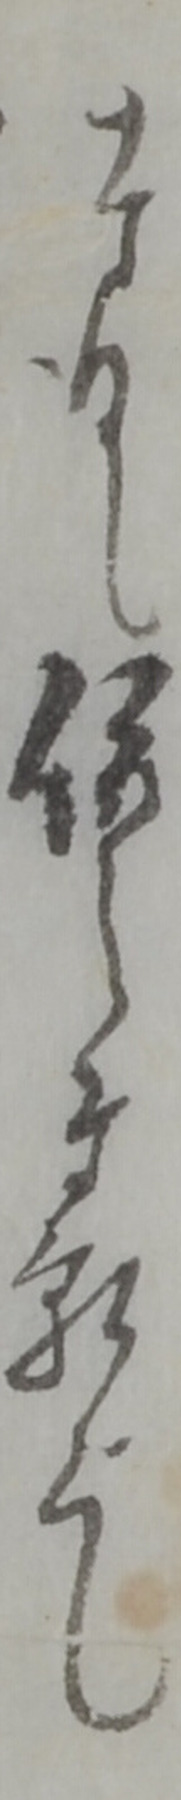奉存候依之奉願上候
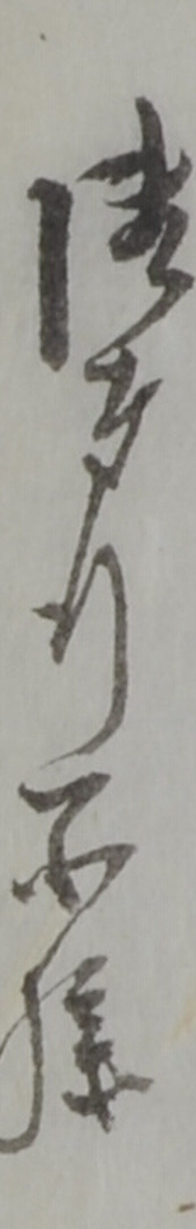御奉行所様
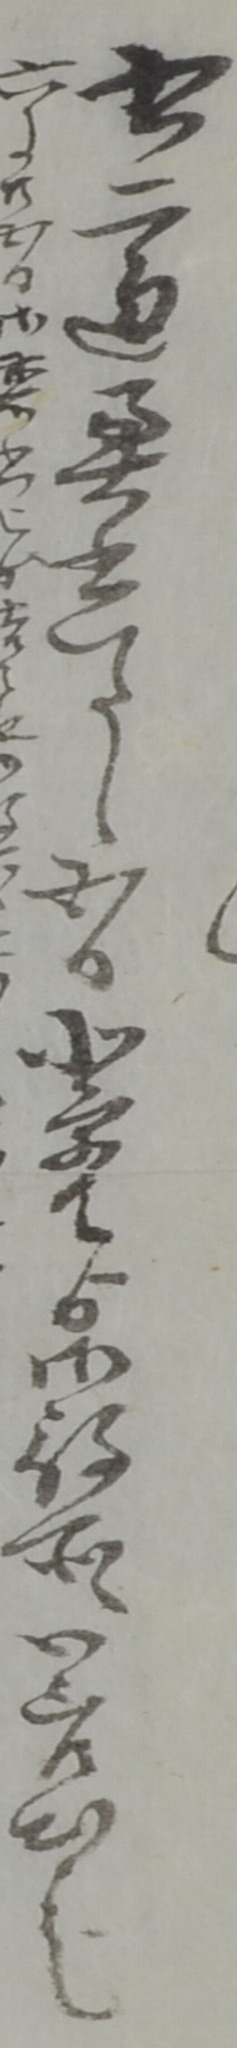右一通奥書いたし五日小泉氏ゟ御役所御差出申候
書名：諸願書控簿
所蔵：伊那市立高遠町図書館・合同会社AMANE
